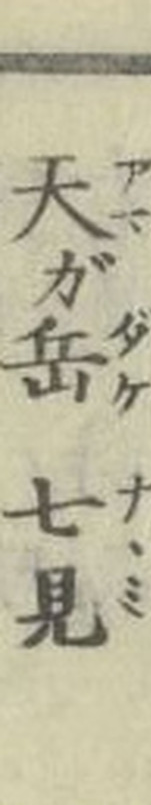天ガ岳七見
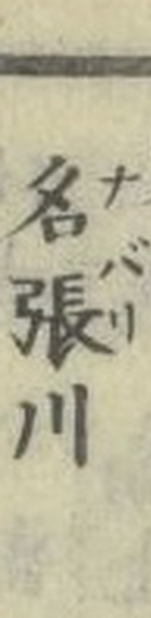名張川
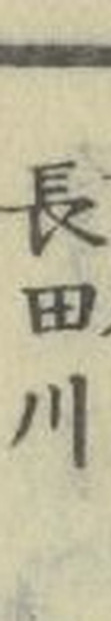長田川
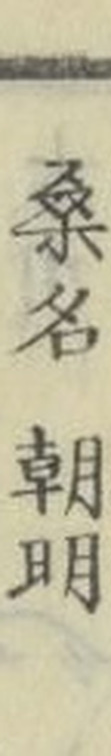桑名朝明
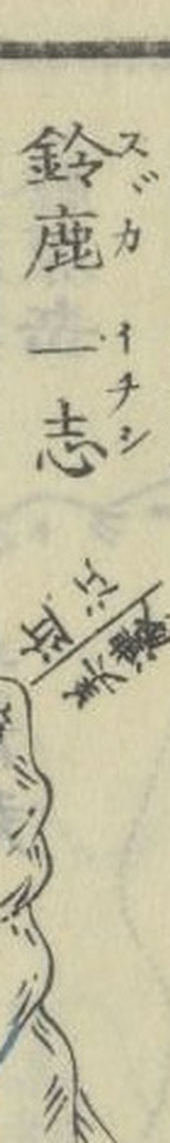鈴鹿一志
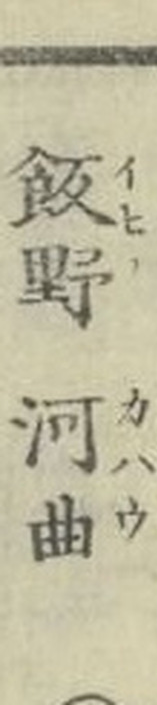飯野河曲
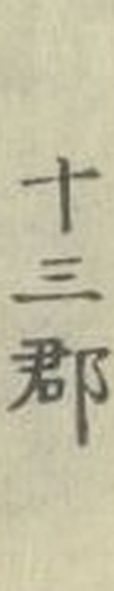十三郡

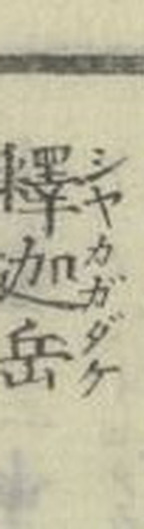釋迦岳
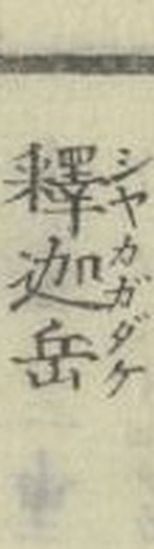釋迦岳
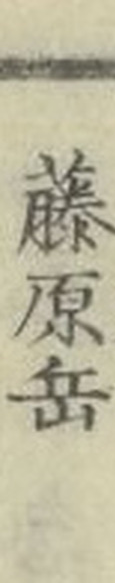藤原岳
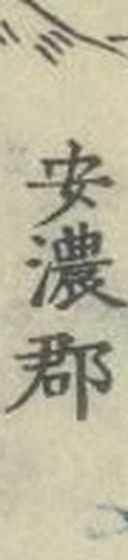安濃津
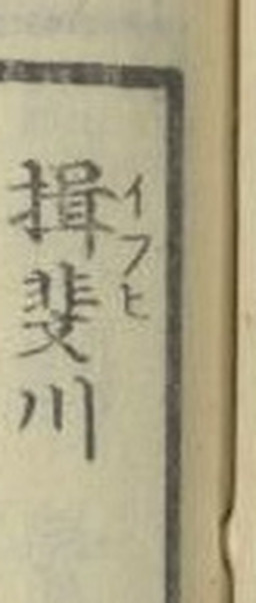揖斐川
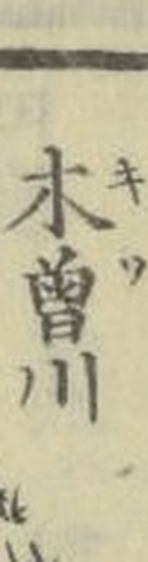木曽川
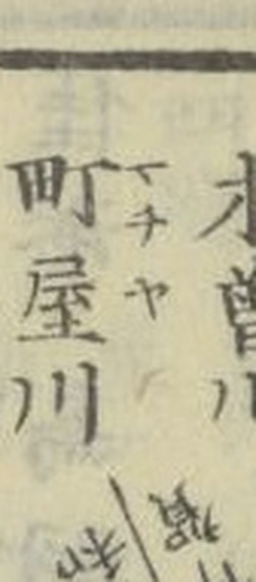町屋川
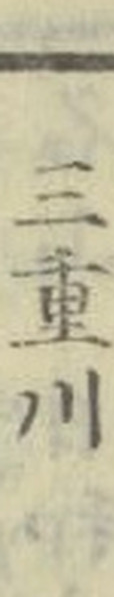三重川
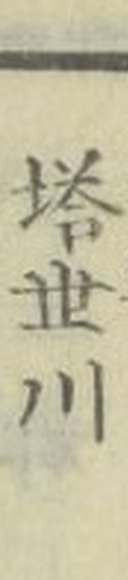搭世川
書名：下等小学日本地誌略図問答 巻上 畿内東海道之部
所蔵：University of the Ryukyus Library
